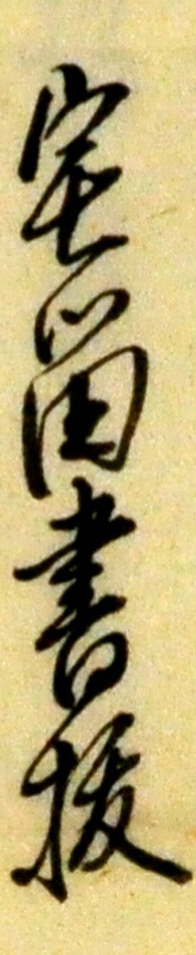宅留書抜

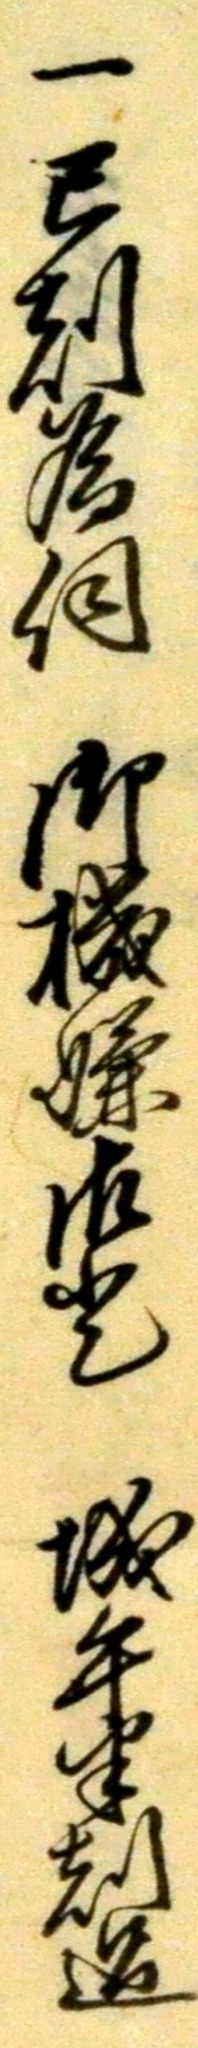一巳刻為伺御機嫌御登城午半刻過
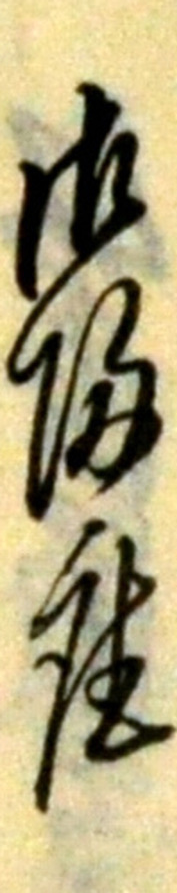御帰座
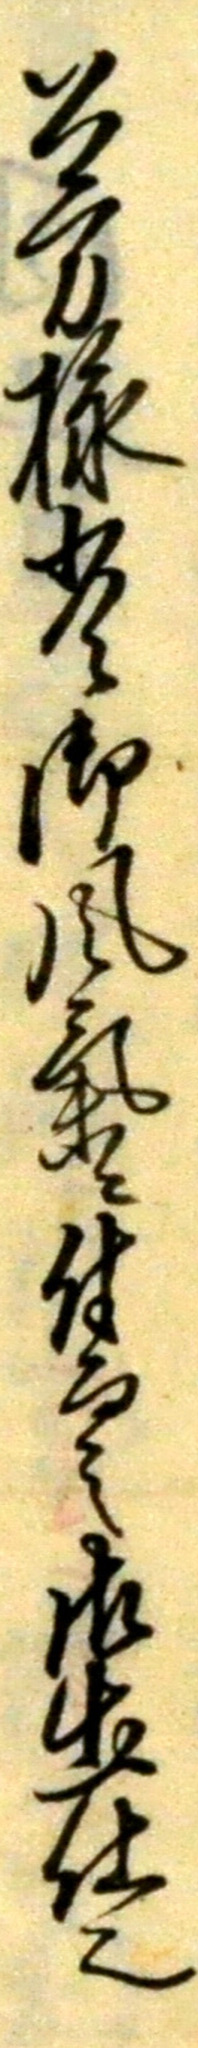公方様常々御風気ニ付而之御出仕也
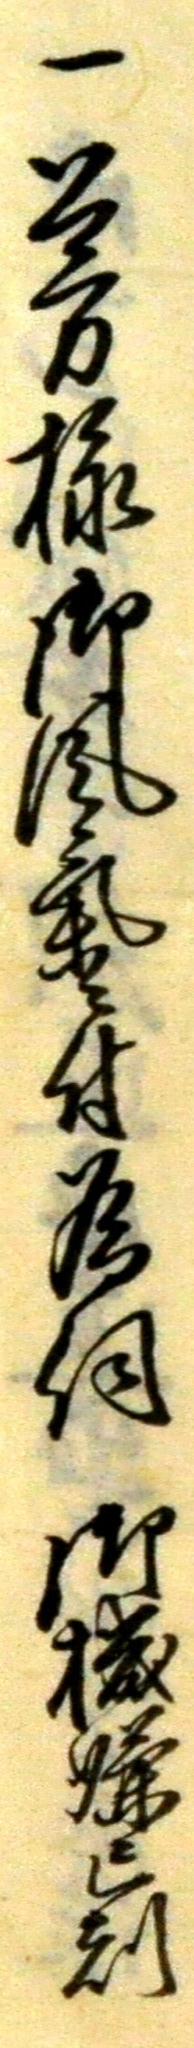一公方様御風気ニ付為伺御機嫌巳刻

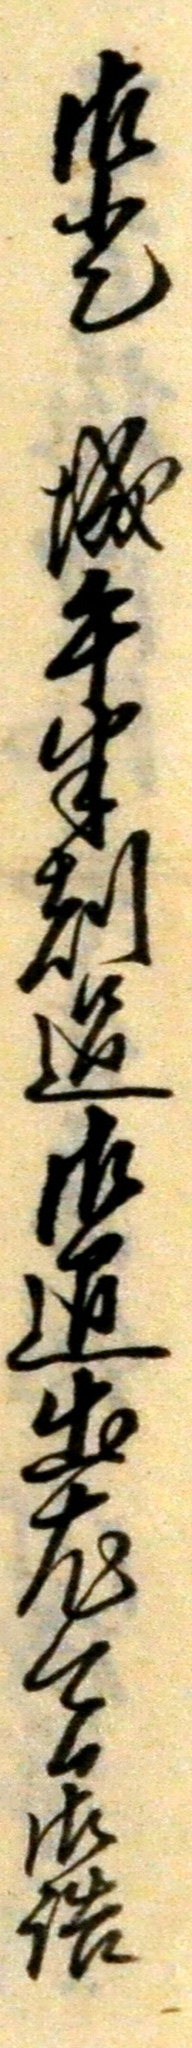御登城午半刻過御退出尤今日御詰
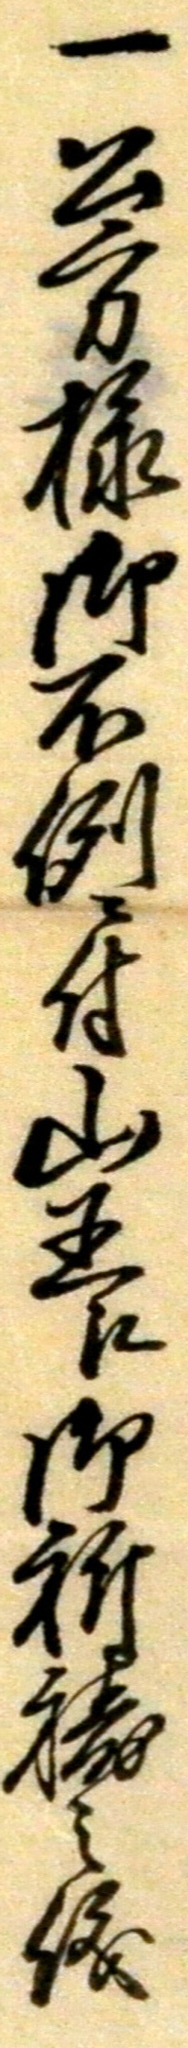一公方様御不例ニ付山王江御祈祷之儀
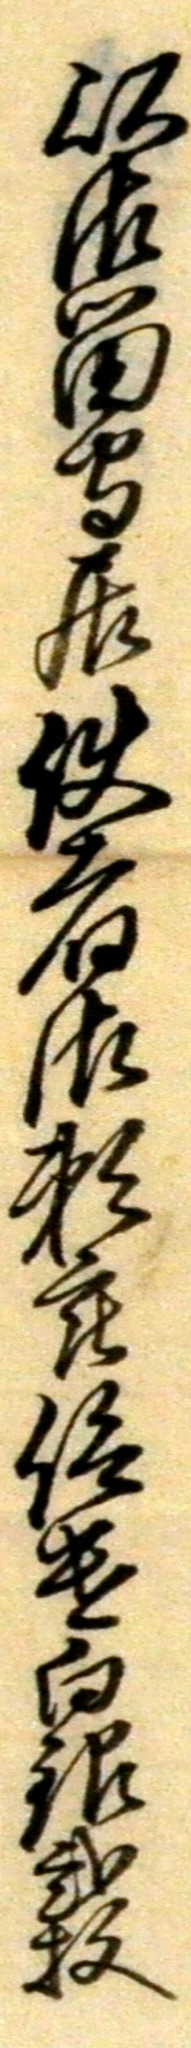以御留守居使者御頼被仰遣白銀弐枚
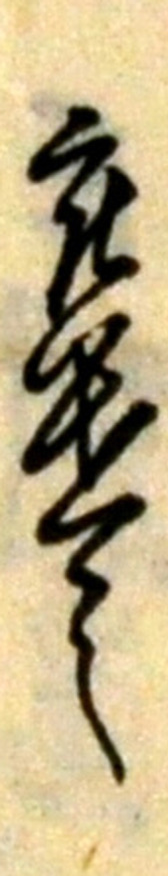被遣之
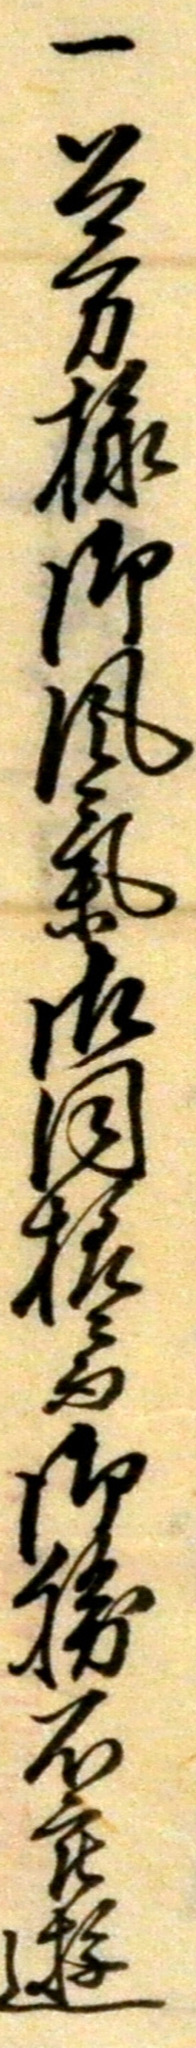一公方様御風気御同様ニ而御勝不被遊
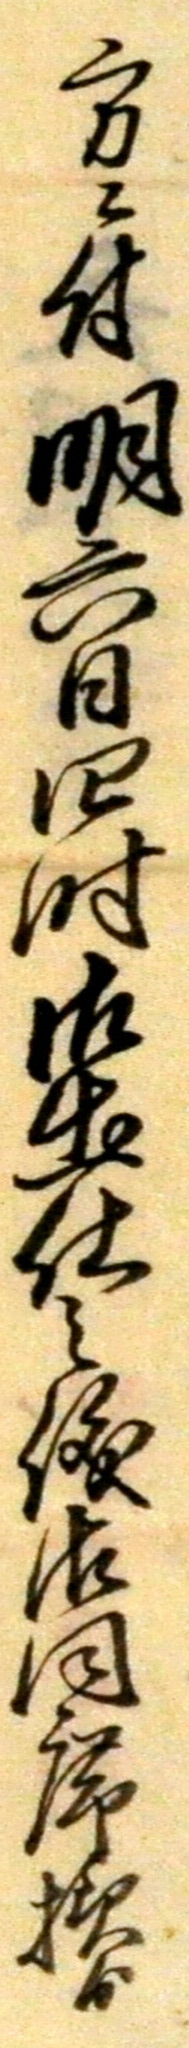方ニ付明六日四時御出仕之儀御同席様ゟ
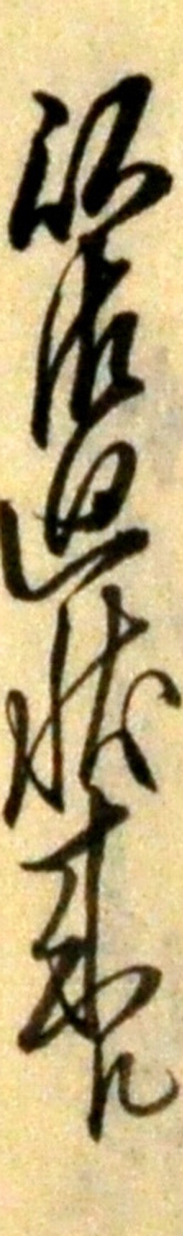以御廻状来ル
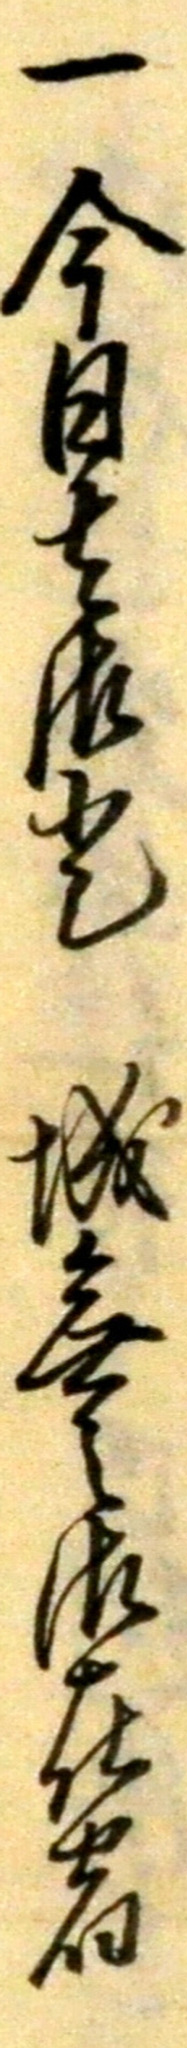一今日者御登城無之御在宿
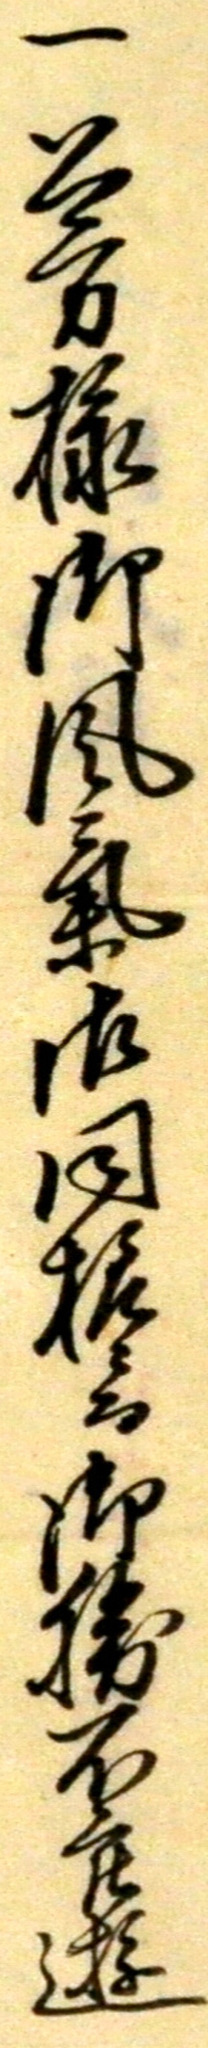一公方様御風気御同様ニ而御勝不被遊
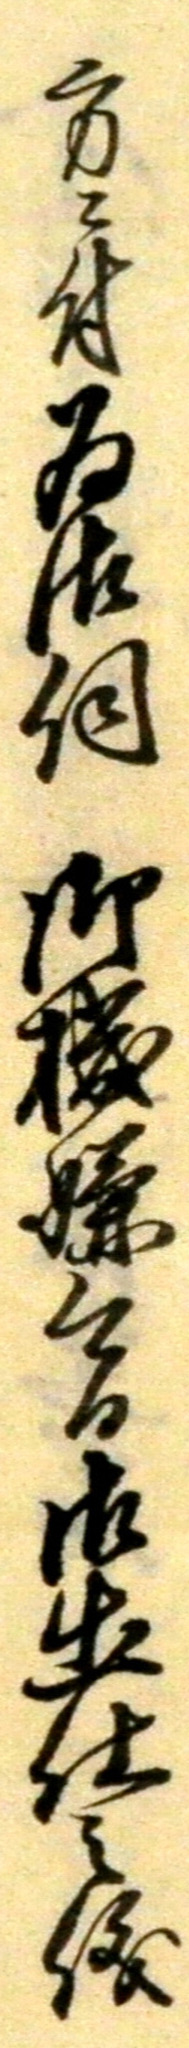方ニ付為御伺御機嫌今日御出仕之儀
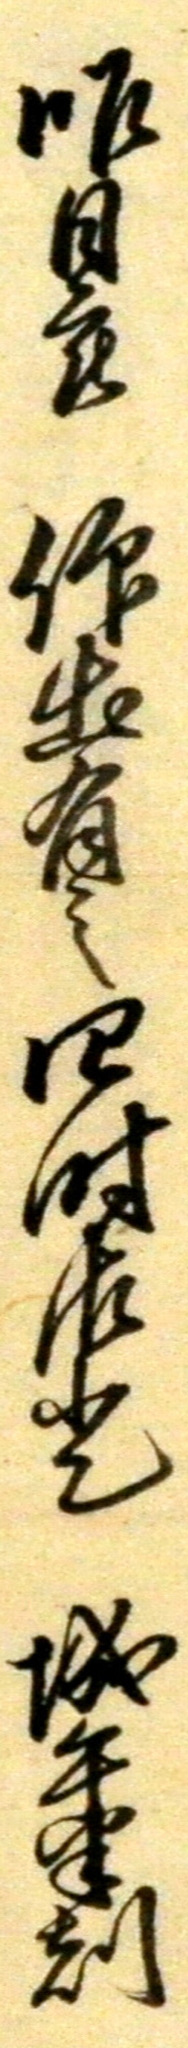昨日被仰出有之四時御登城午半刻
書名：書抜
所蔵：伊那市立高遠町図書館・合同会社AMANE
